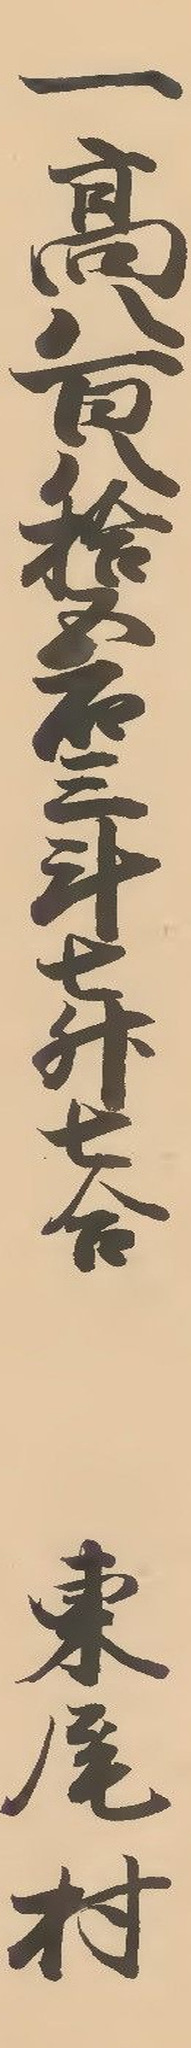一髙八百八拾五石三斗七升七合東尾村
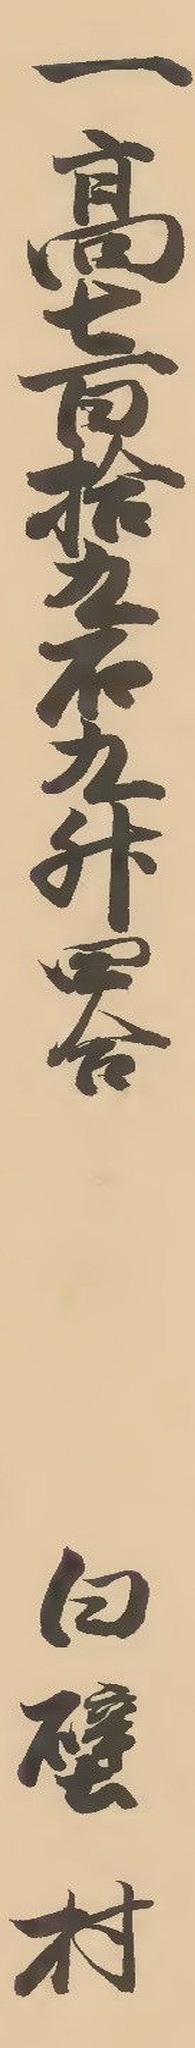一髙七百拾九石九升四合白壁村

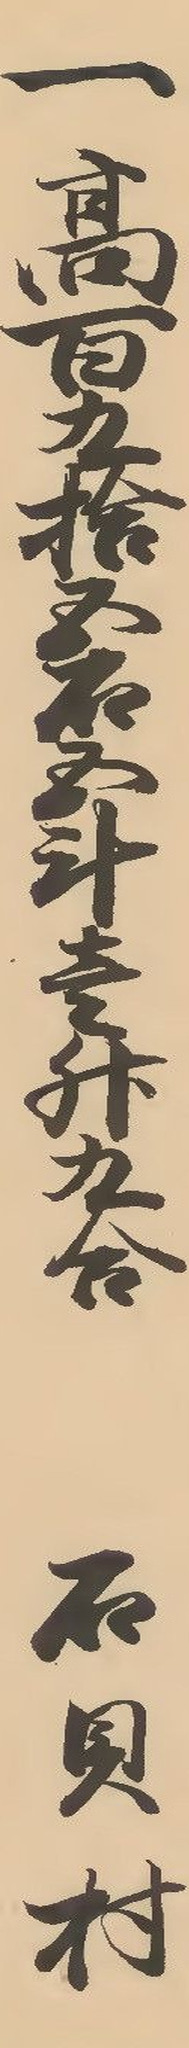一髙百九拾五石五斗壱升九合石貝村
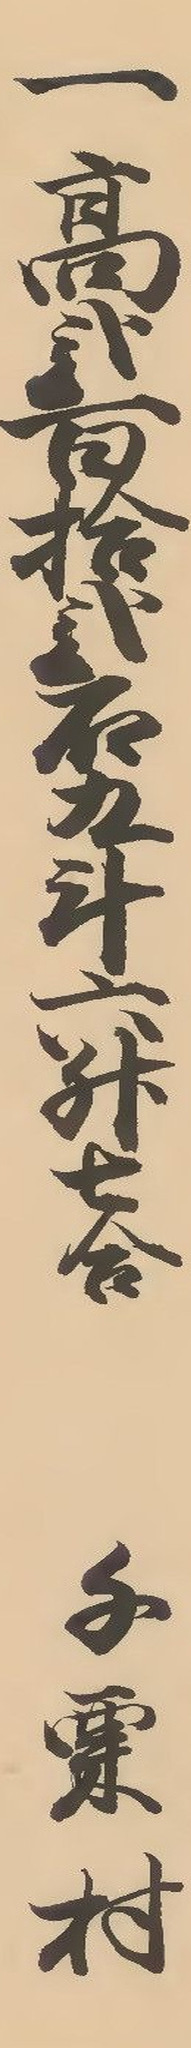一髙弐百拾弐石九斗六升七合千栗村
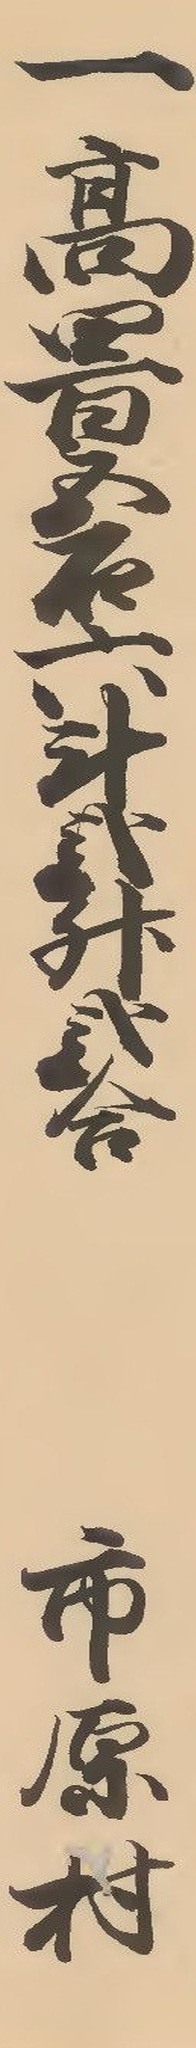一髙四百五石六斗弐升弐合市原村
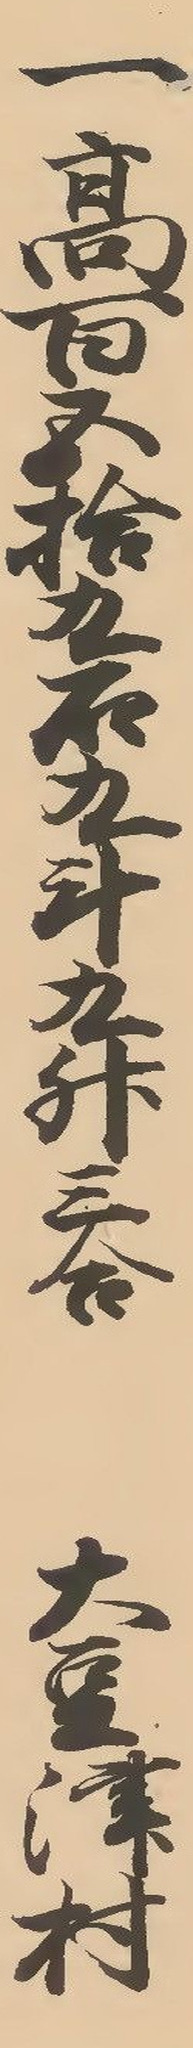一髙百五拾九石九斗九升三合大豆津村
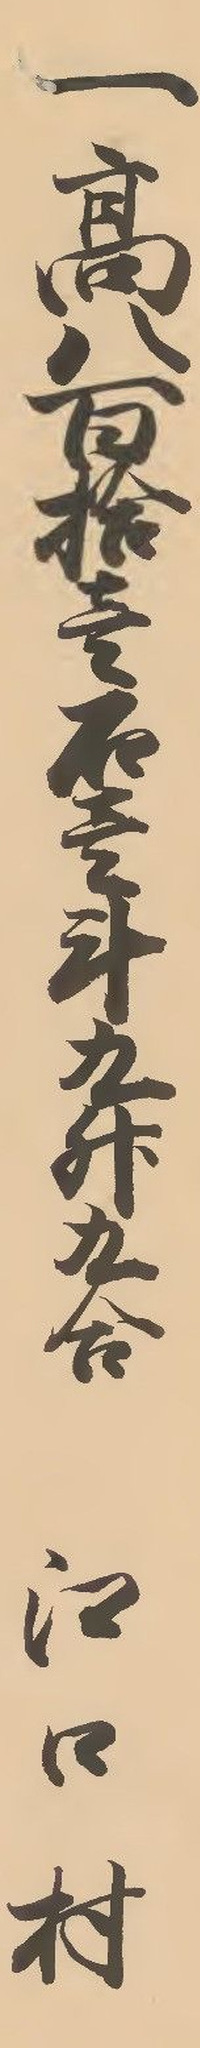一髙八百拾壱石壱斗九升九合江口村
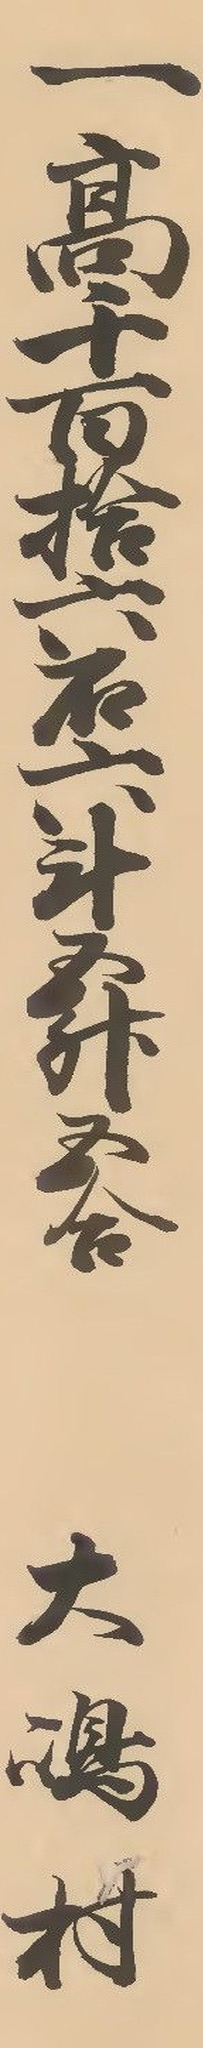一髙千百拾六石六斗五升五合大嶋村
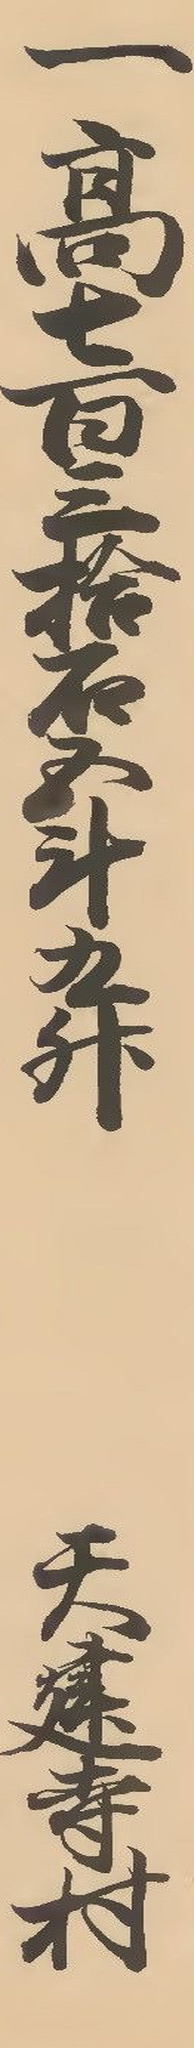一髙七百三拾石五斗九升天建寺村
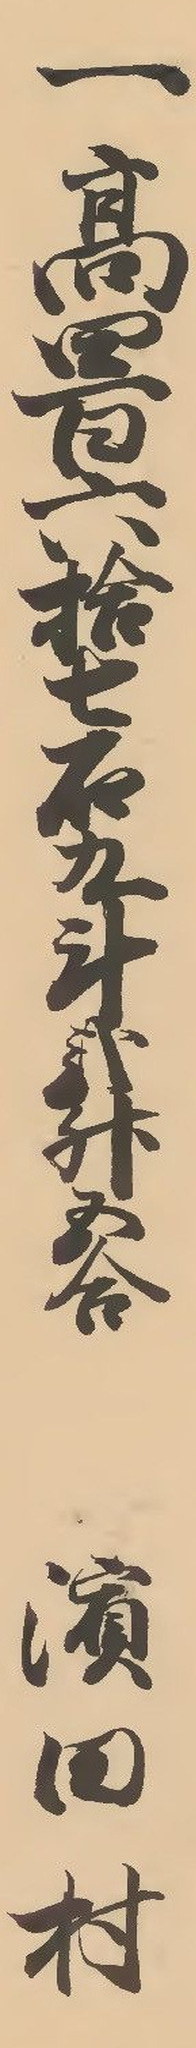一髙四百六拾七石九斗弐升五合濱田村

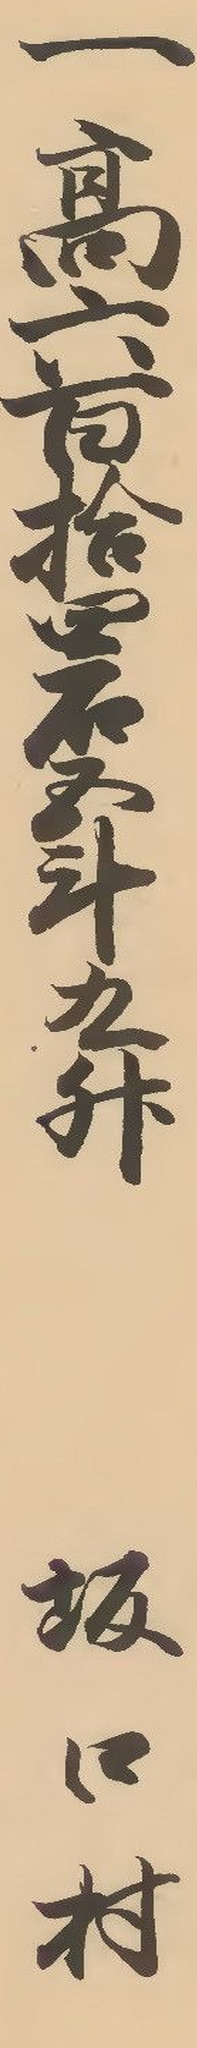一髙六百拾四石五斗九升坂口村
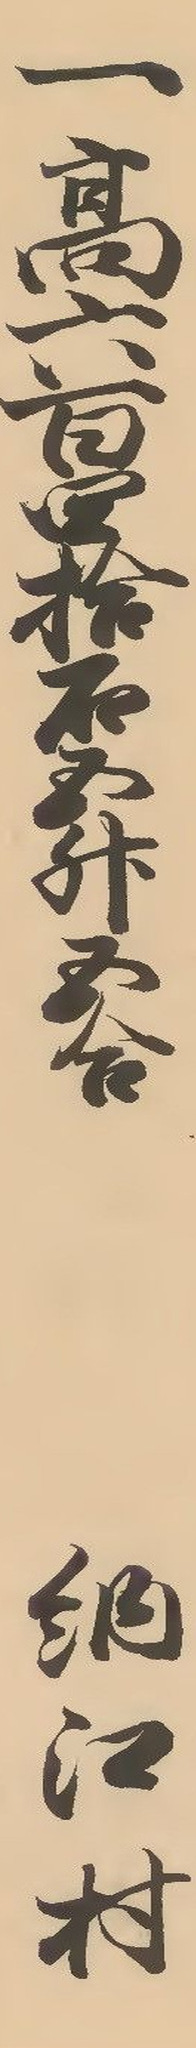一髙六百四拾石五升五合納江村
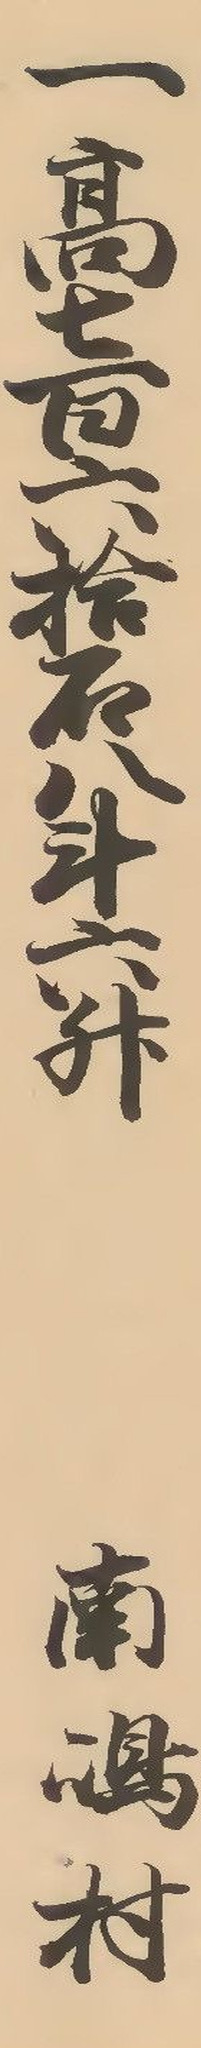一髙七百六拾石八斗六升南嶋村
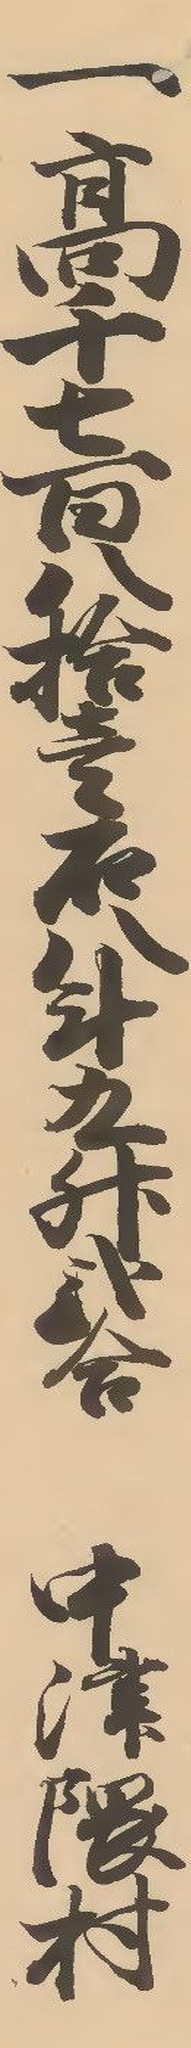一髙千七百八拾壱石八斗九升弐合中津隈村
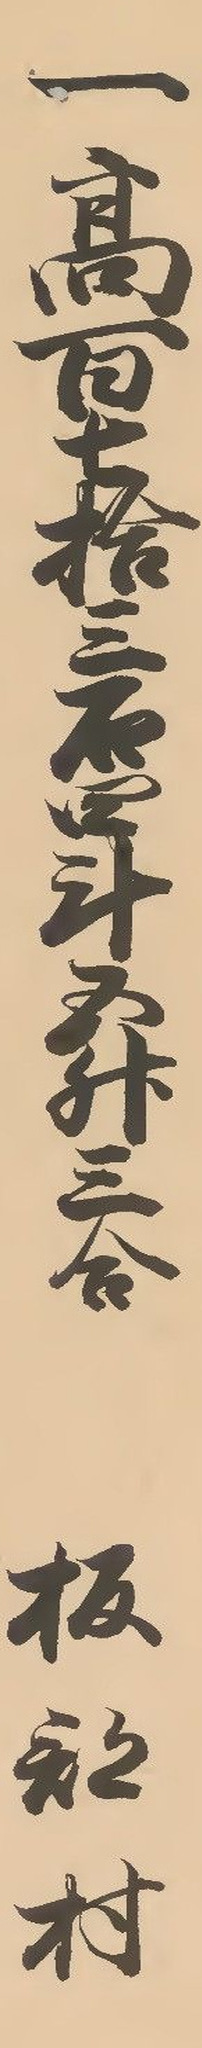一髙百七拾三石四斗五升三合板部村
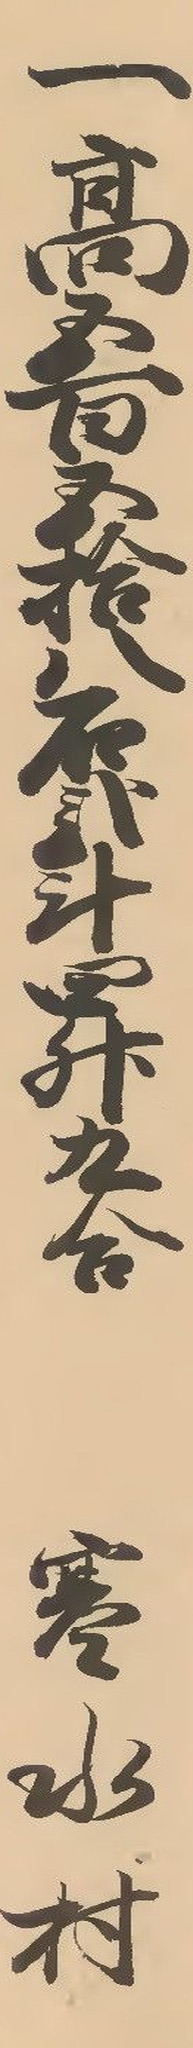一髙五百五拾八石弐斗四升九合寒水村
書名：肥前国郷帳
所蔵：国立公文書館 National Archives of Japan
